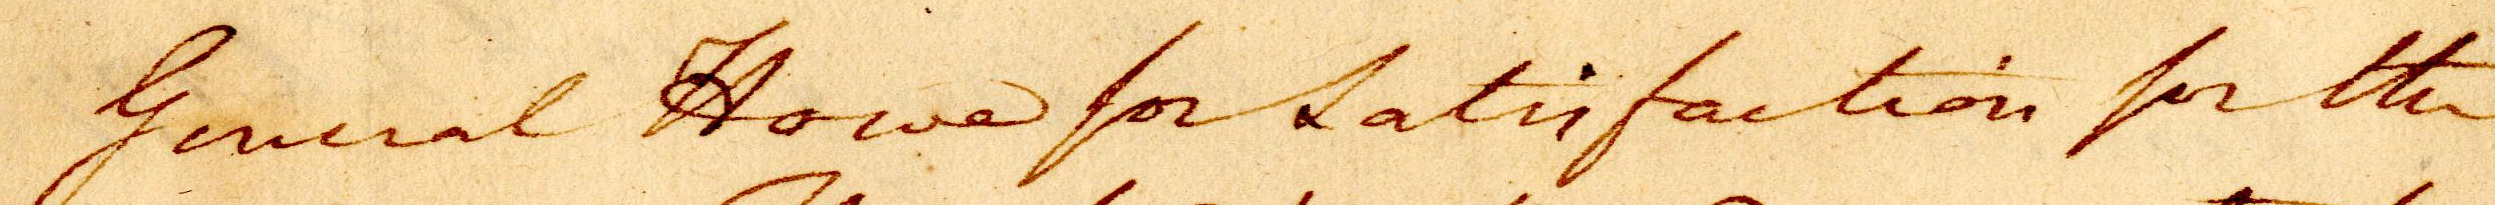General Howe for Satisfaction for the
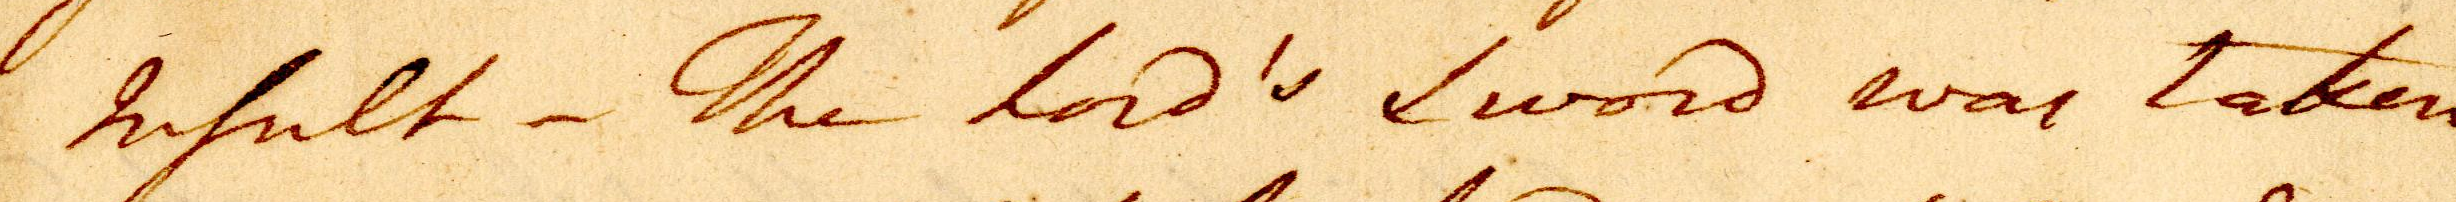Insult. The Lord's Sword was taken
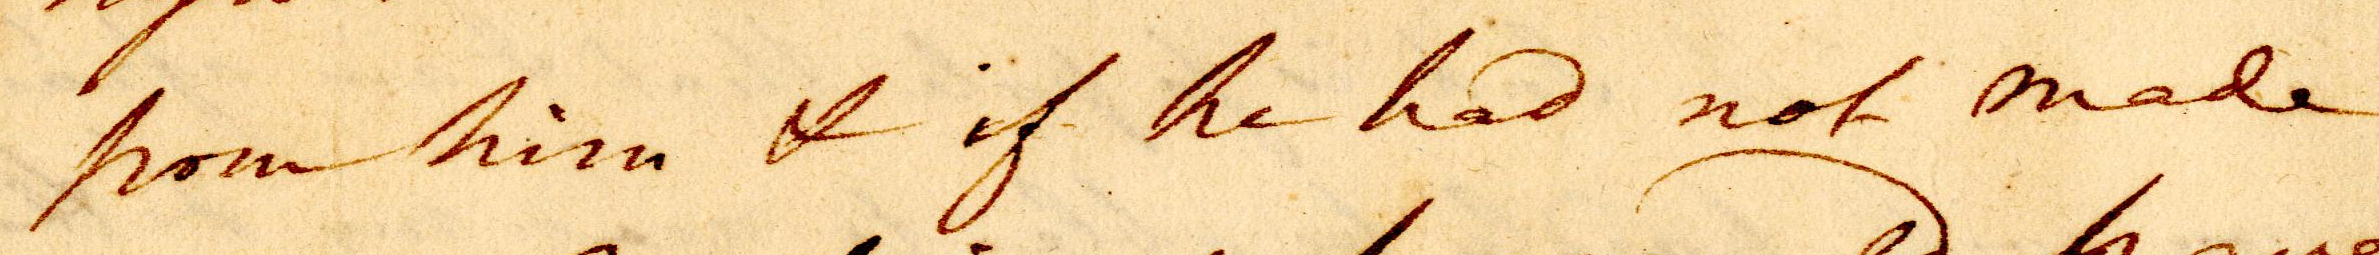from him & if he had not made
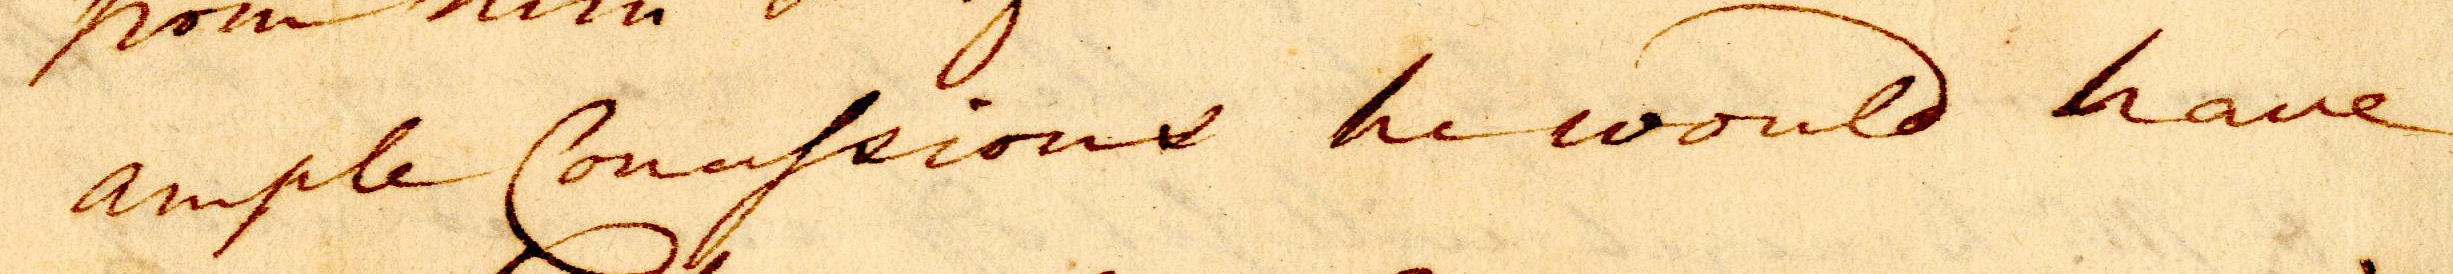ample Concessions he would have
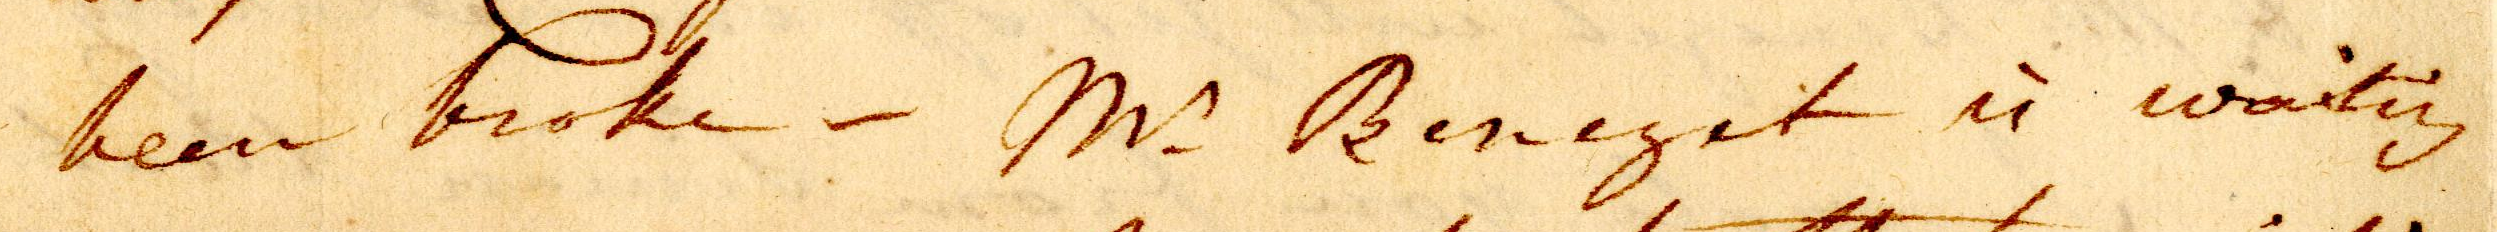been broke. M^r Benezet is waiting
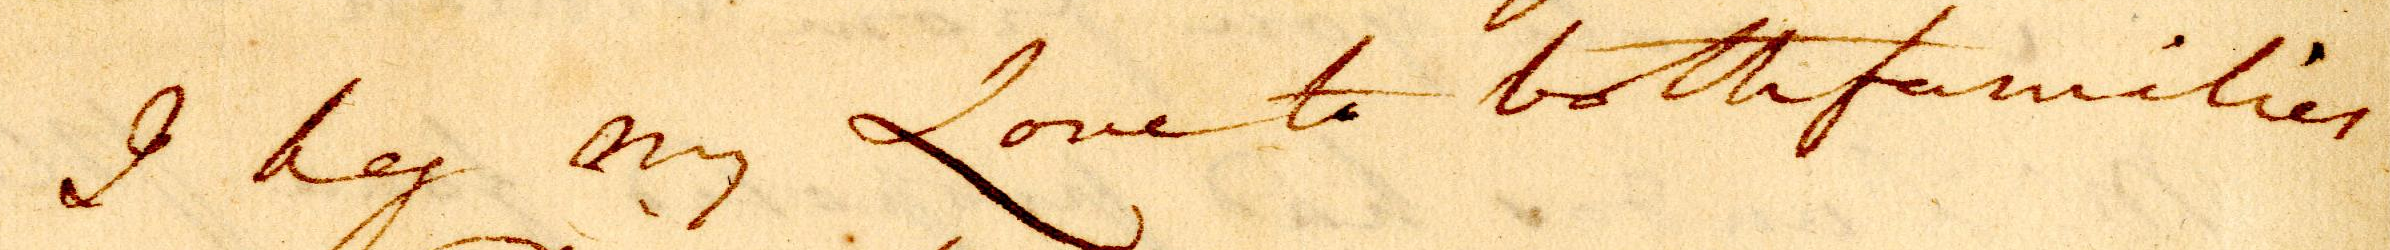I beg my Love to both families
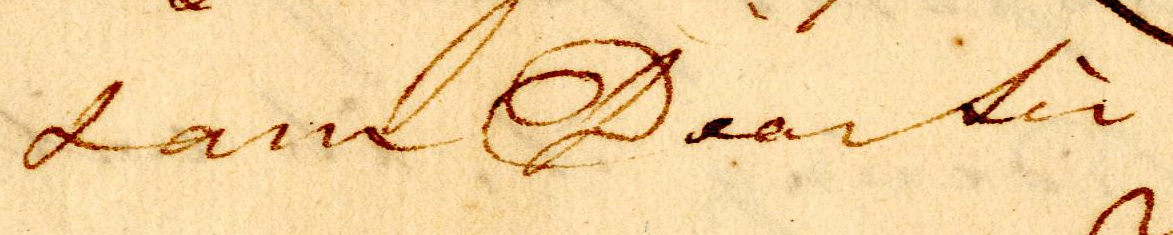I am Dear Sir
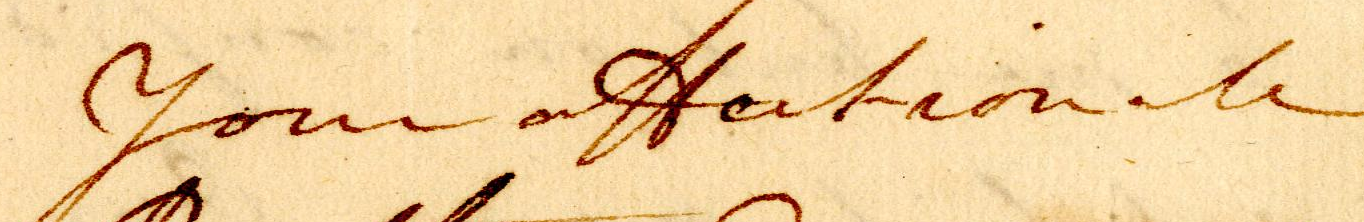Your affectionate
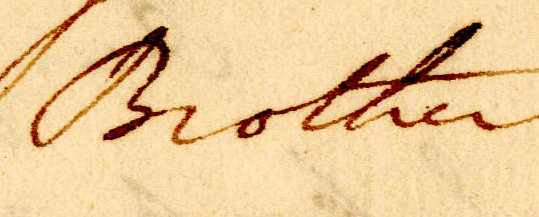Brother
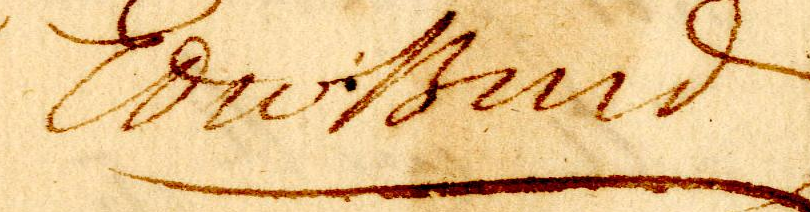Edw. Burd
